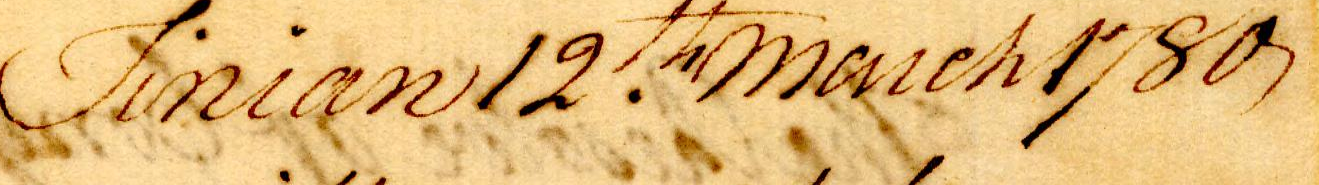Tinian 12^th March 1780
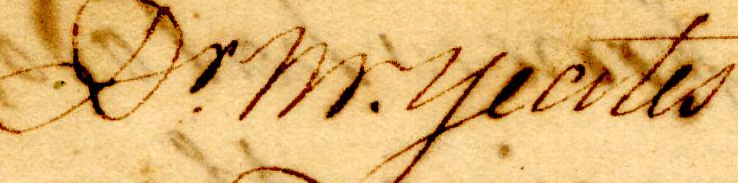D^r. M^r. Yeates
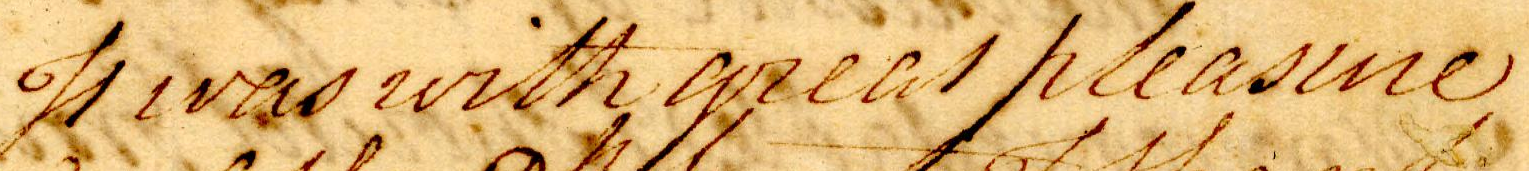It was with great pleasure
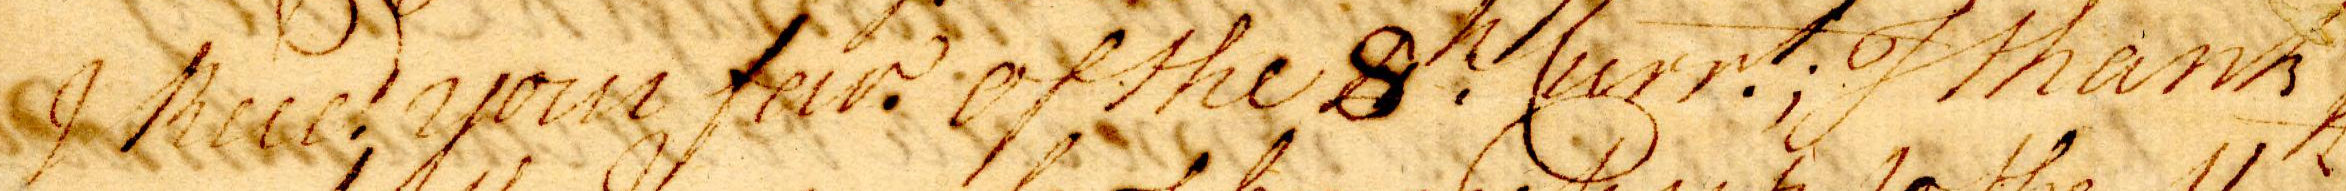I Rece^d Your fav. of the 8^th: Curr.; I thank
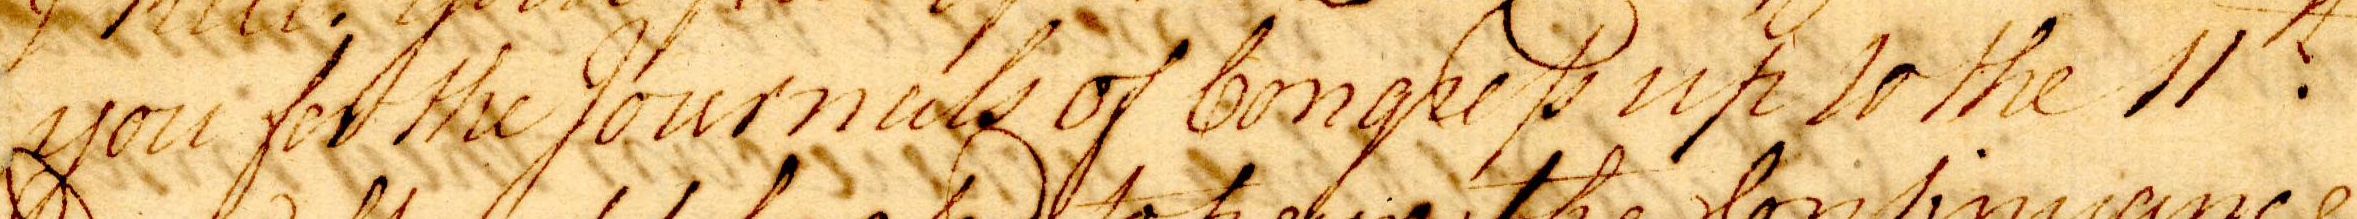you for the Journals of Congress up to the 11^th.
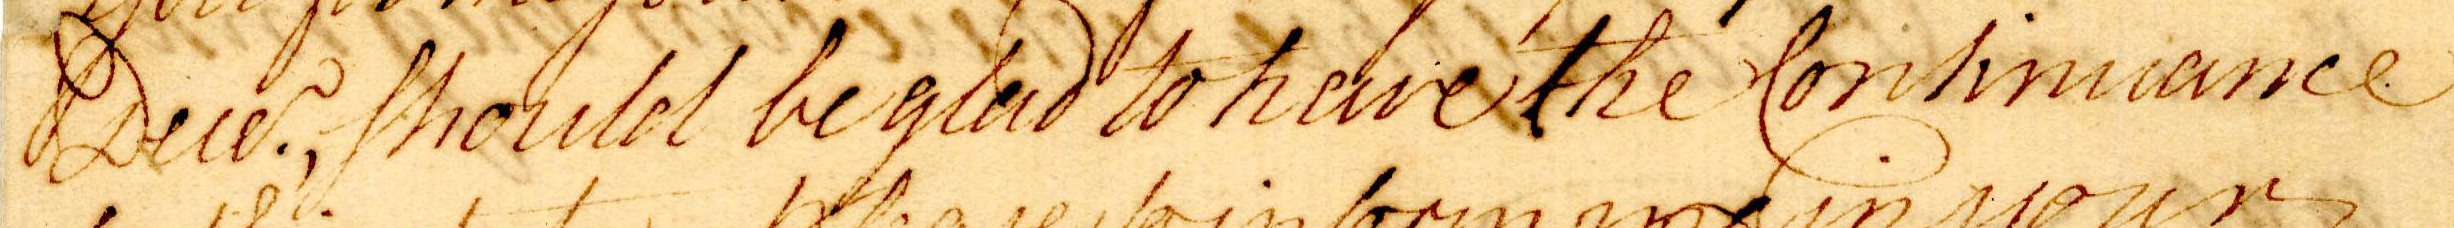Dece^r., should be glad to have the Continuance
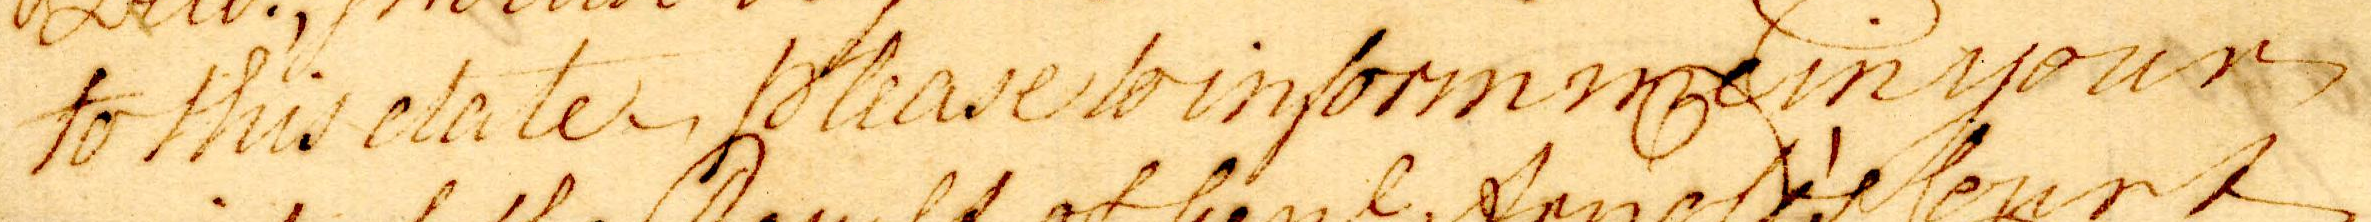to this date. Please inform me in your
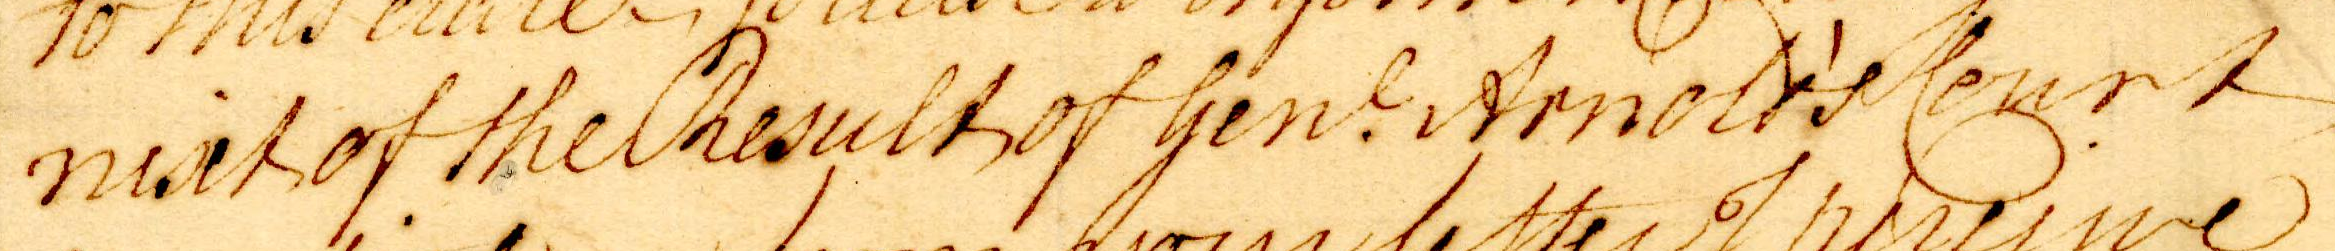next of the Result of Gen^l. Arnold's Court
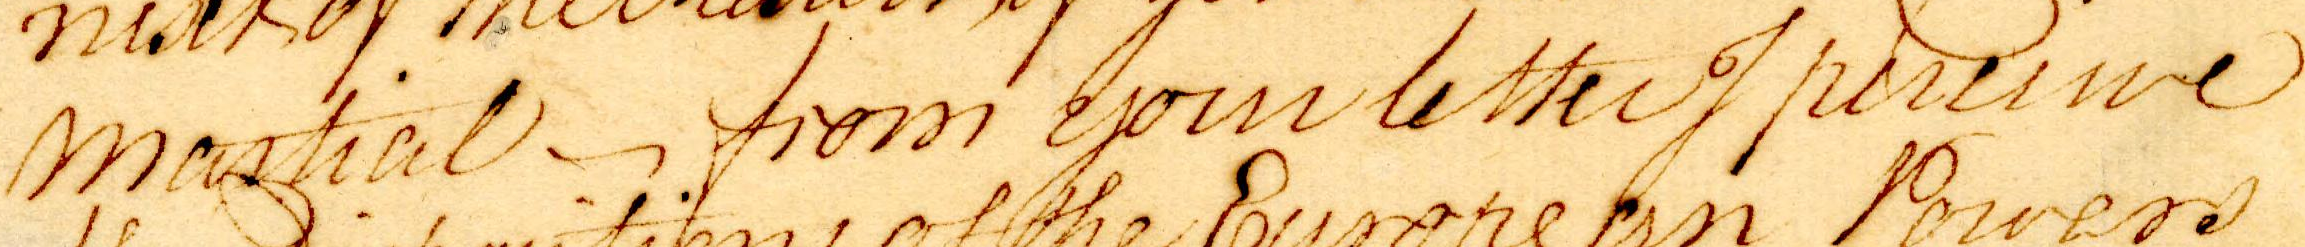martial. from your letter I perceive
